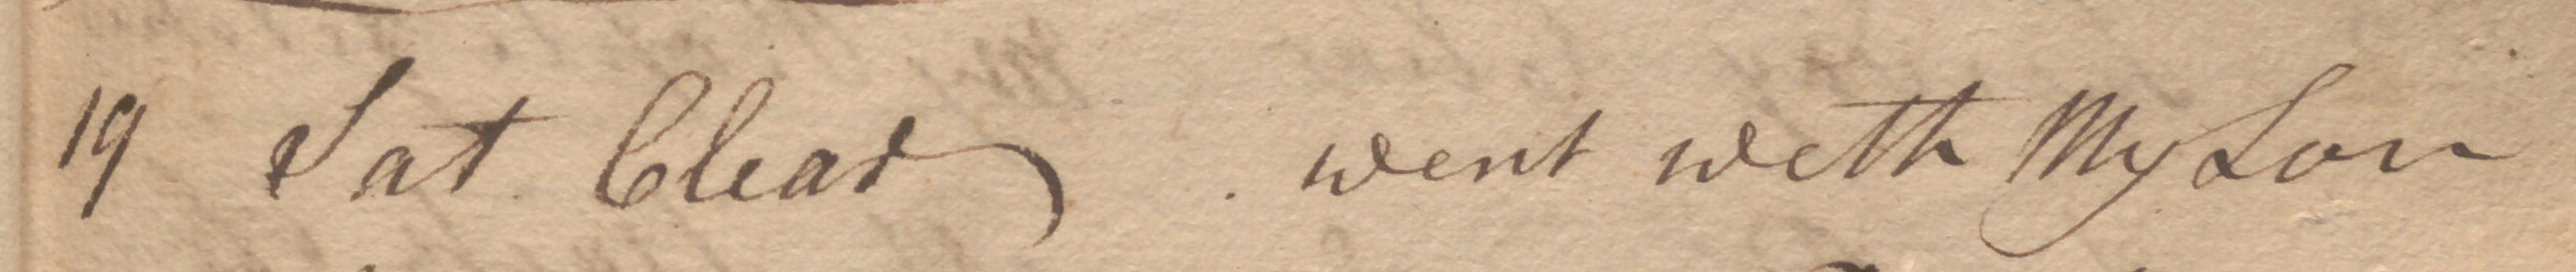19 Sat Clear went with My son
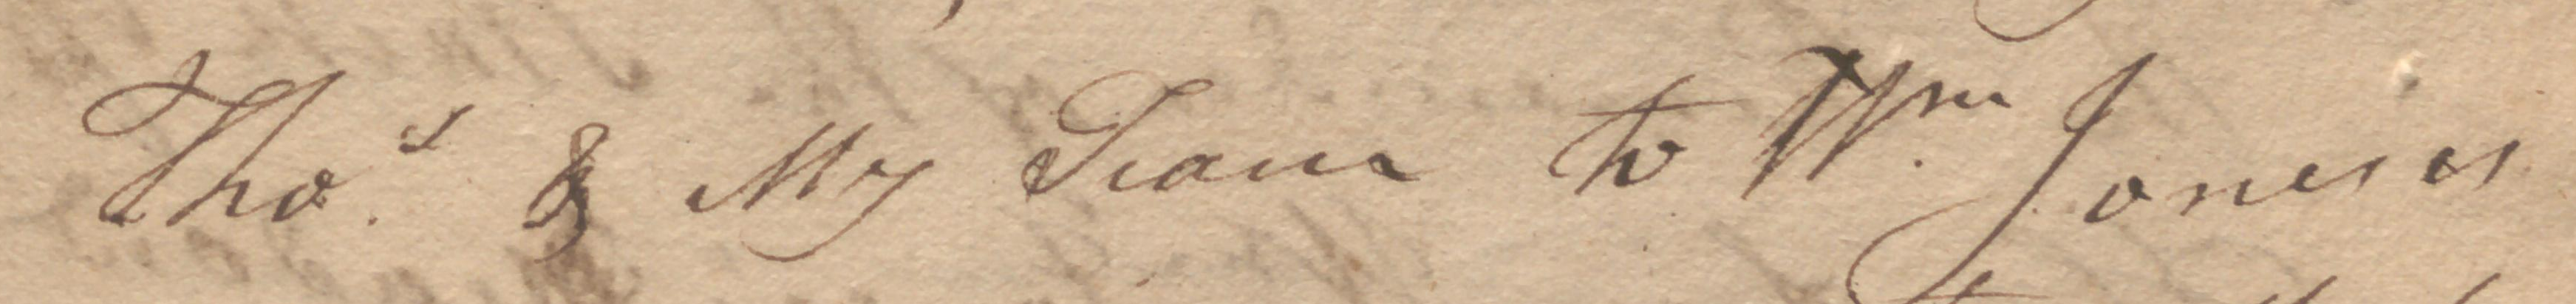Tho^s. & My Team to W^m. Joneses
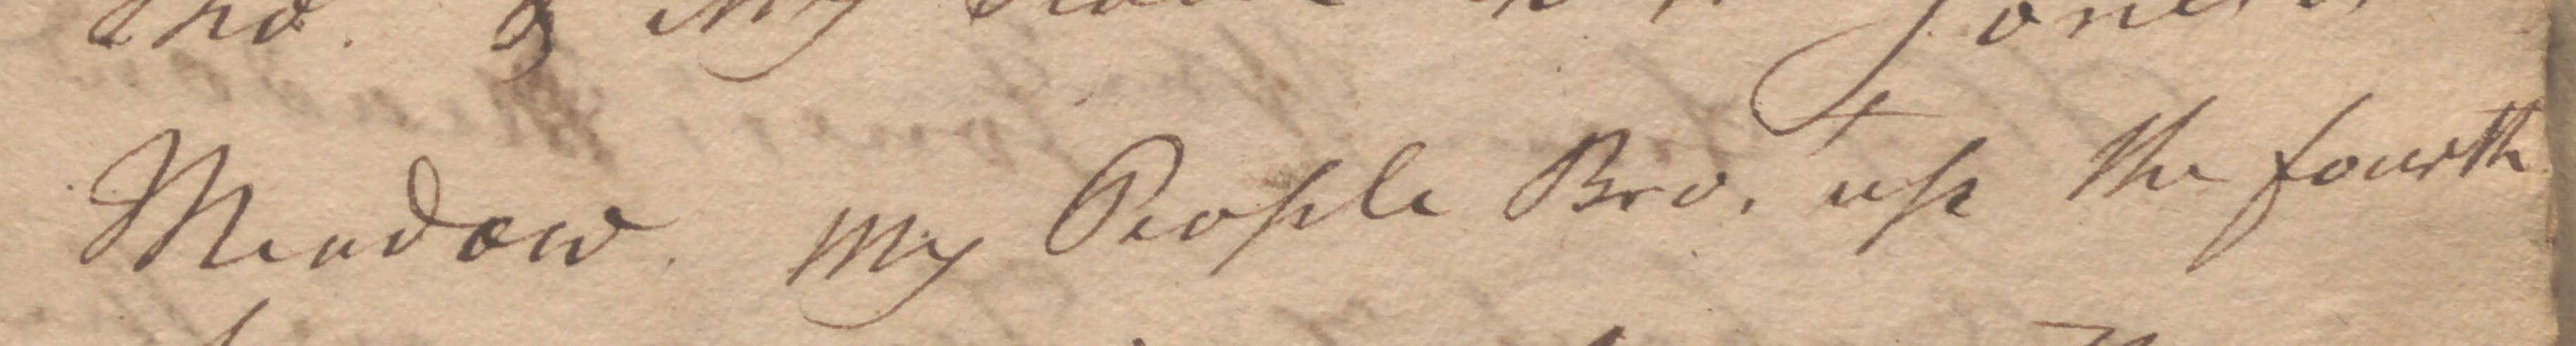Meadow. My People Bro^t. up the fourth
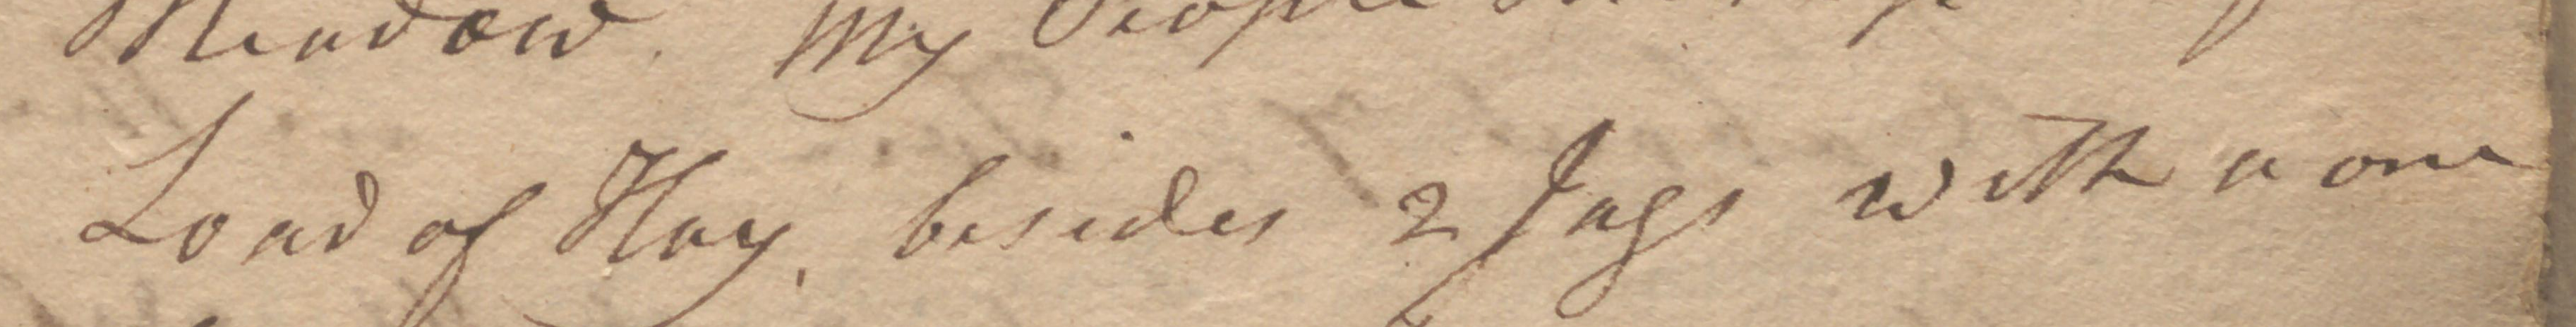Load of Hay besides 2 Jags with a one
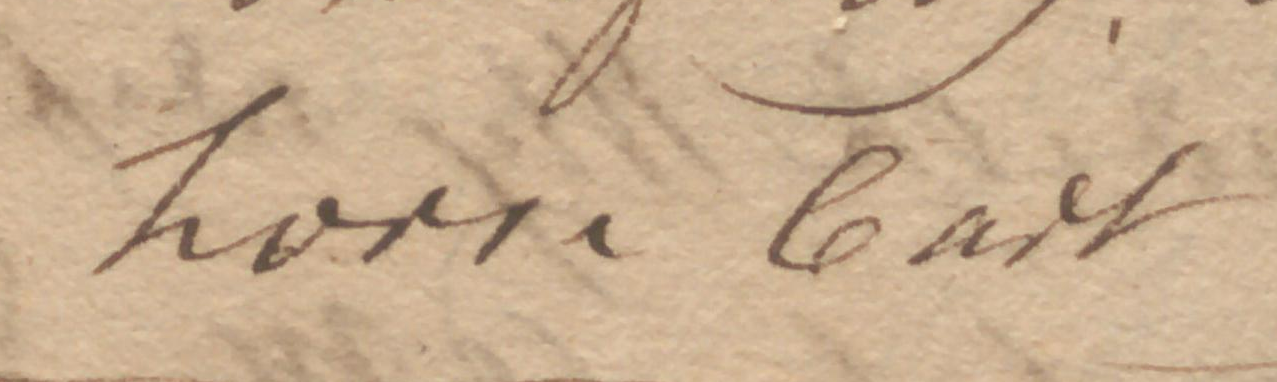horse Cart
